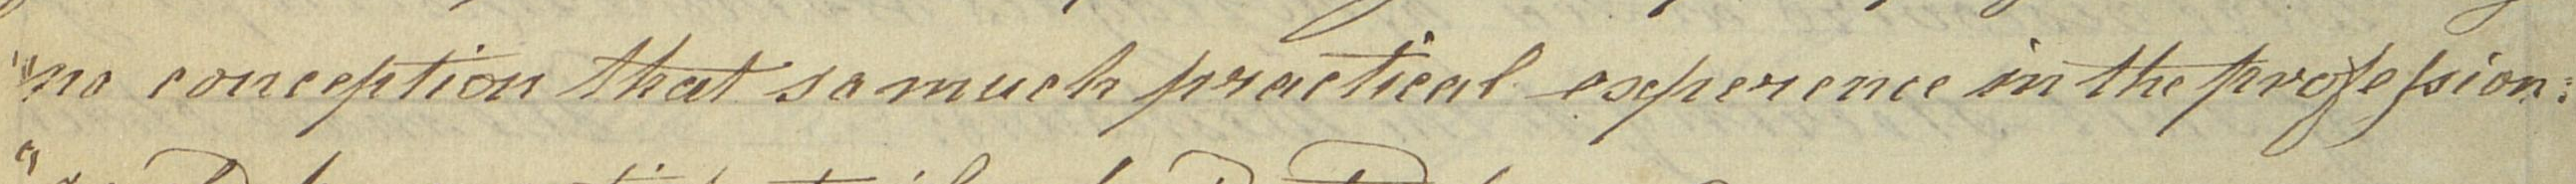"no conception that so much practical experience in the profession:
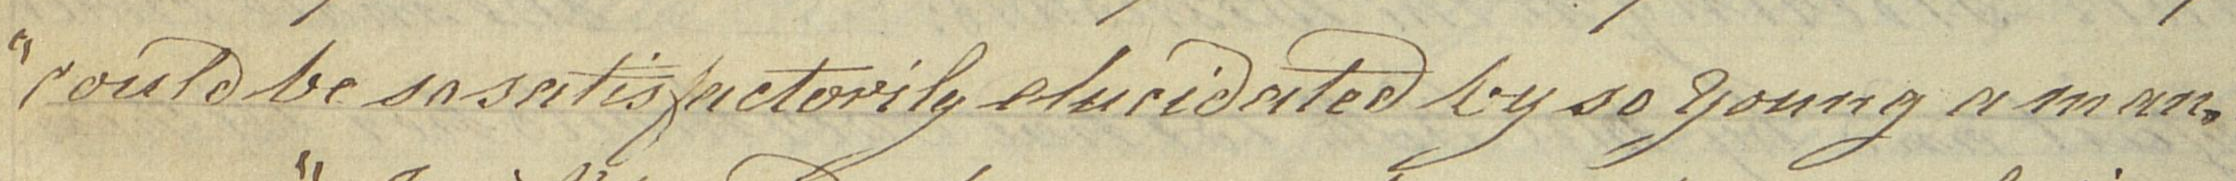"could be satisfactorily elucidated by so young a man.
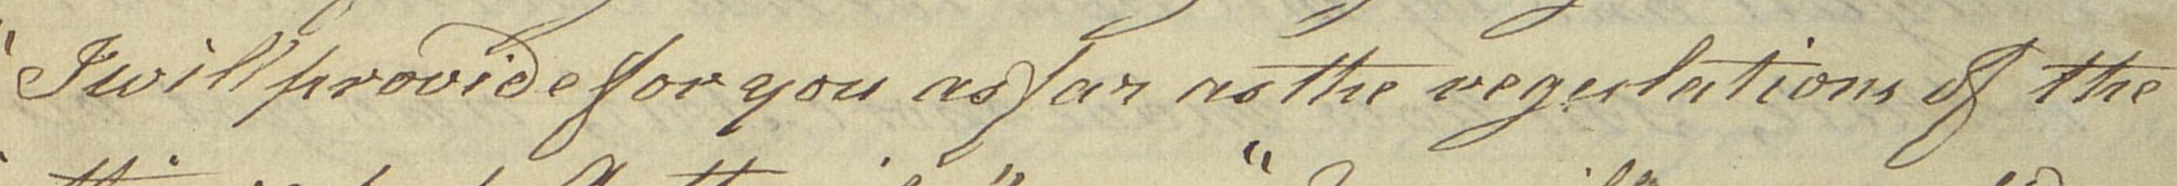I will provide for you as far as the regulations of the
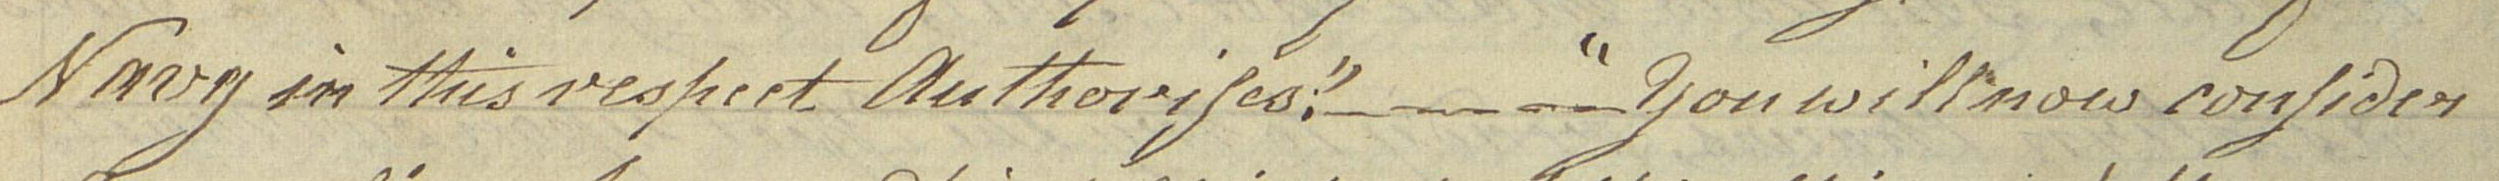Navy in this respect Authorises:" "You will now consider
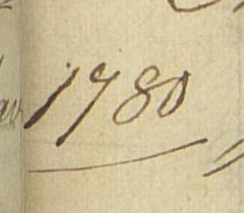1780
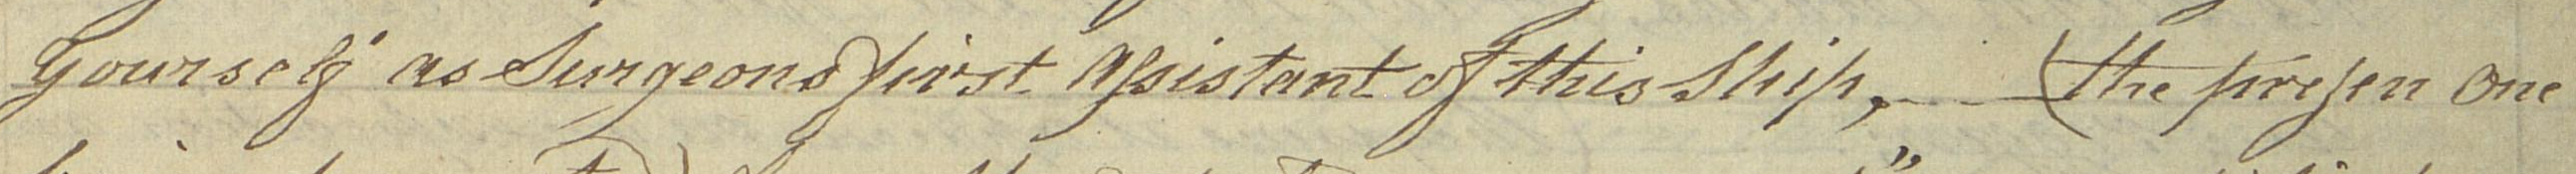youserlf as Surgeons First Assistant of this Ship, (the presen one
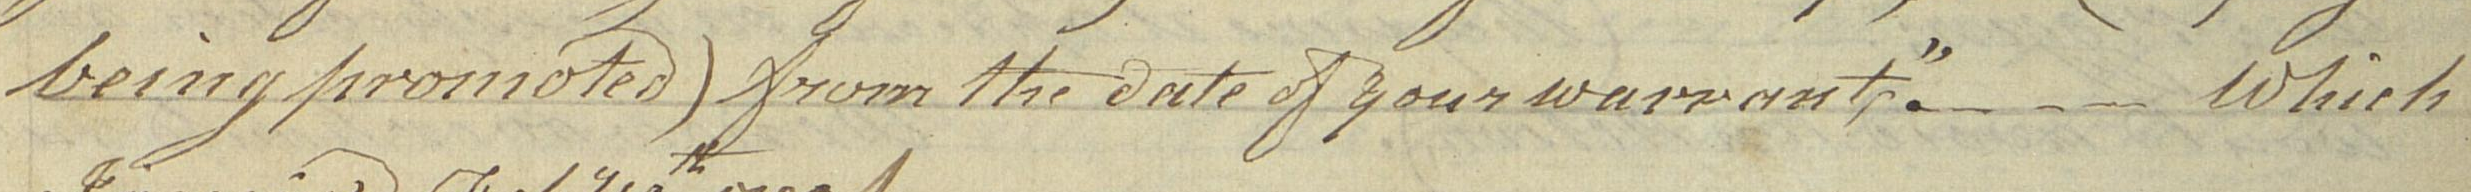being promoted) from the date of your warrant." Which
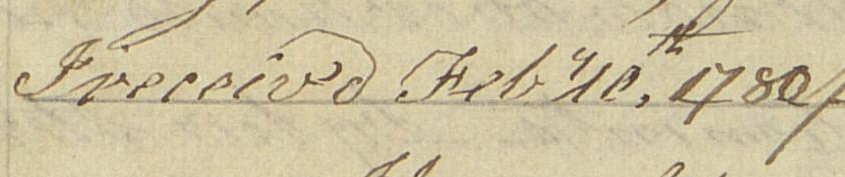I receiv'd Feb^y 10^th. 1780
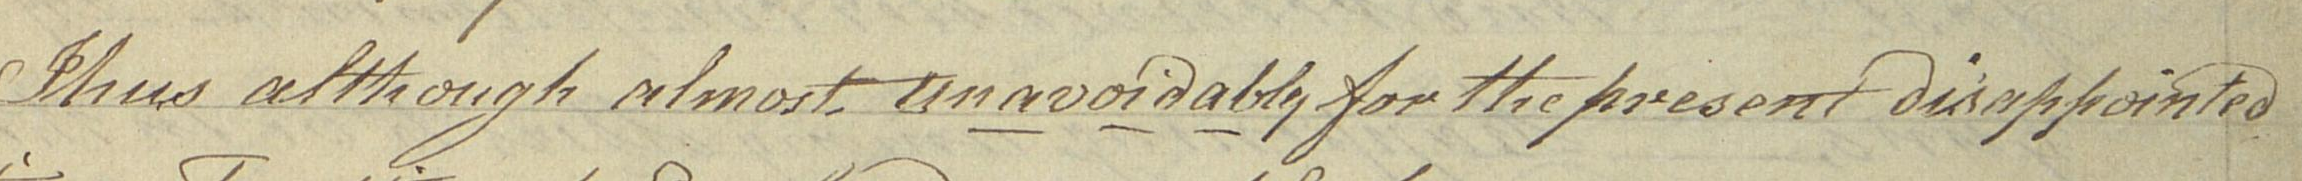Thus although almost unavoidably for the present disappointed
